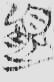○（履）
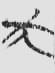犬
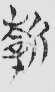新
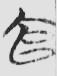官
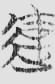連
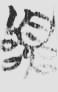囂
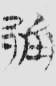郙
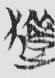趞
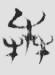犇
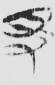○（得）
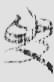受
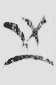之
